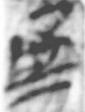爲
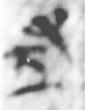○（右）
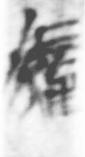○（服）
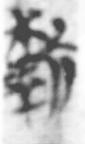新（新）
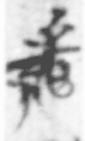○（造）
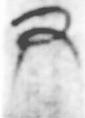尹
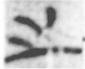之
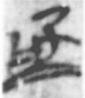爲
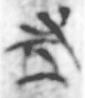○（右）
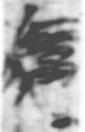驂
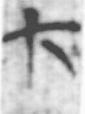大
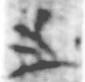之
